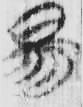昜（陽）
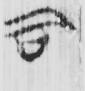司
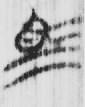馬
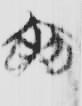寅
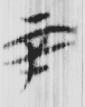辛
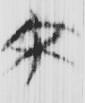宋
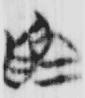爲
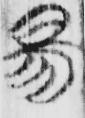昜（陽）
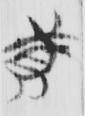貸
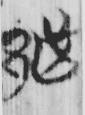○（越）
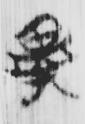異
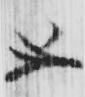之
